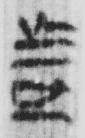者
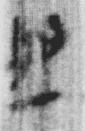也
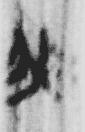非
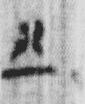之
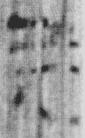而
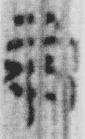不
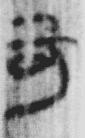可
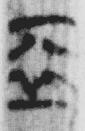亞（惡）
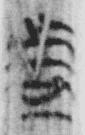者
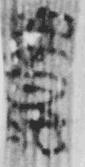○（篤）
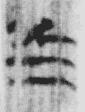於
